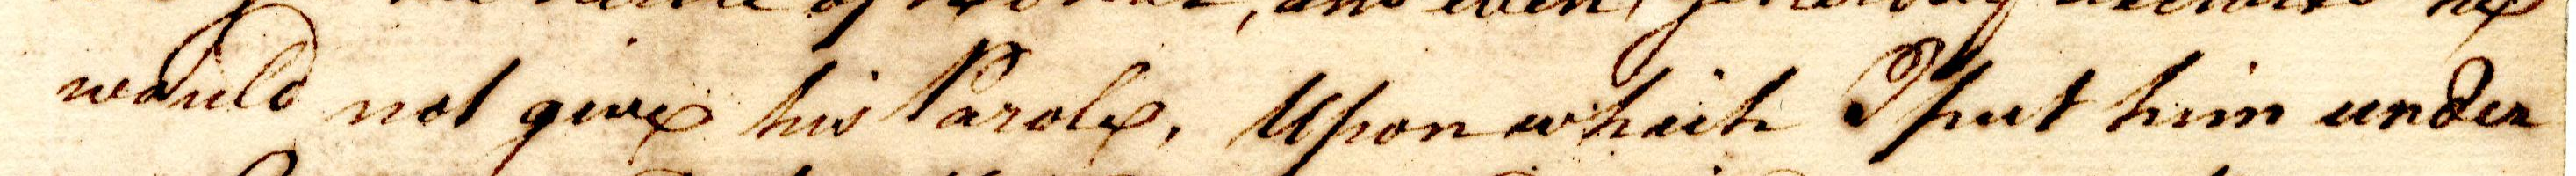wduld not give his Parole, Upon which I put him under
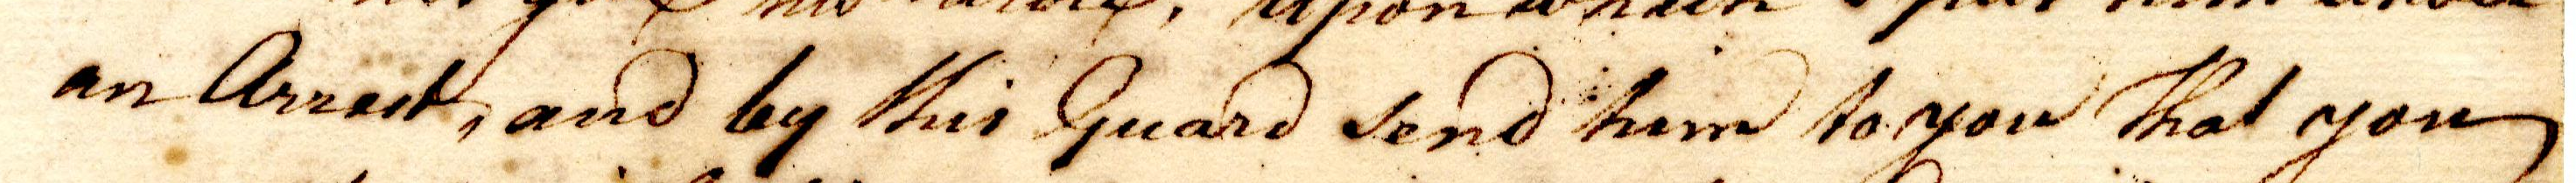an Arrest, and by this Guard send him to you that you
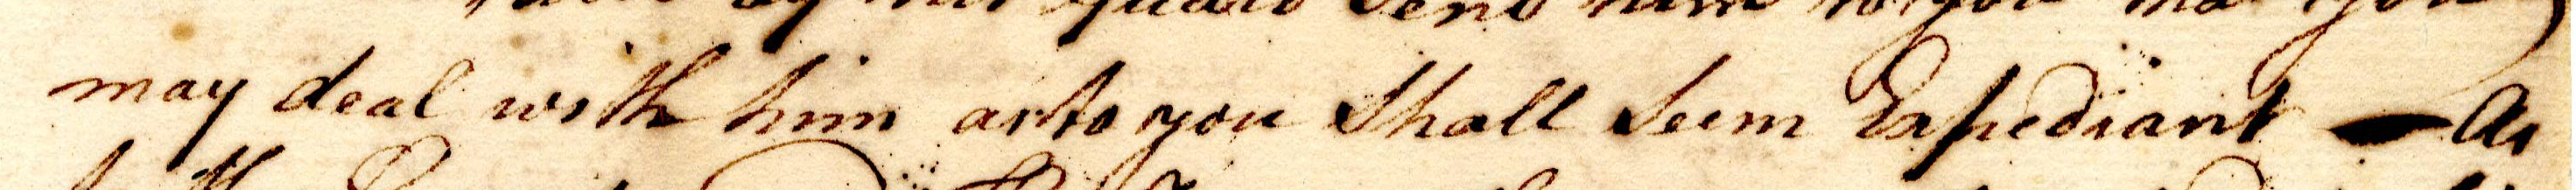may deal with him as to you shall seem Expediant. As
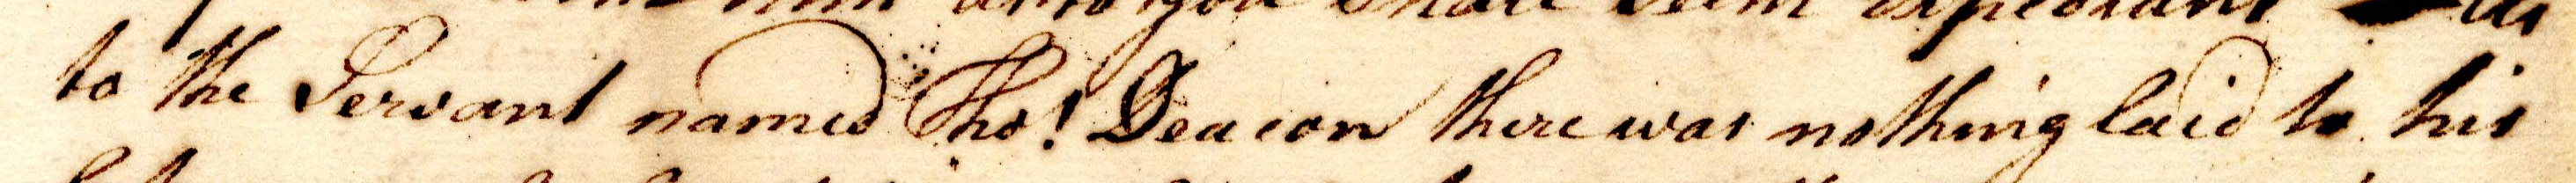to the Servant named Tho^s. Deacon there was nothing laid to his
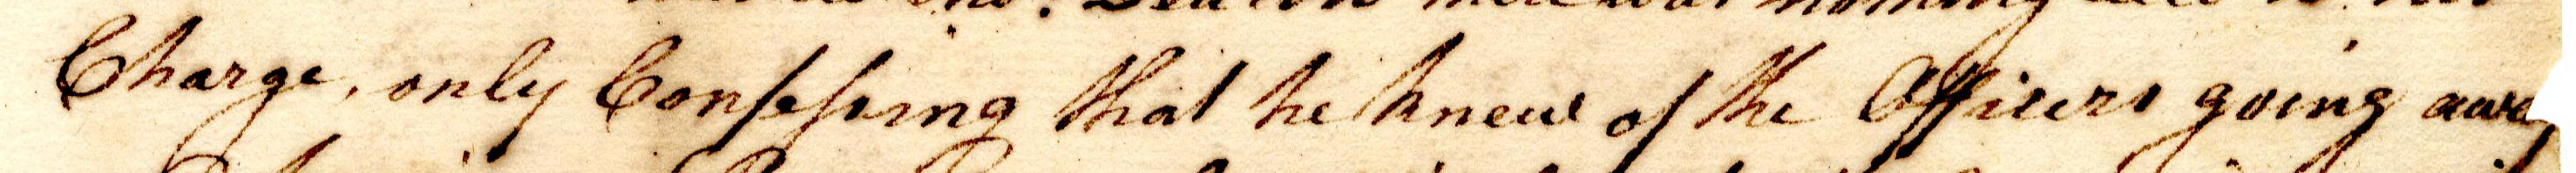Charge, only Confessing that he knew of the Officers going away
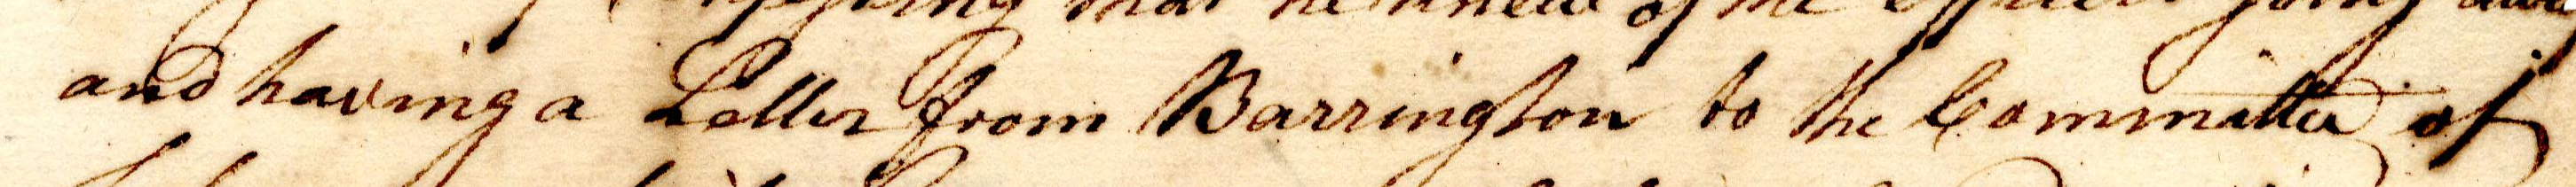and having a Letter from Barrington to the Committee of
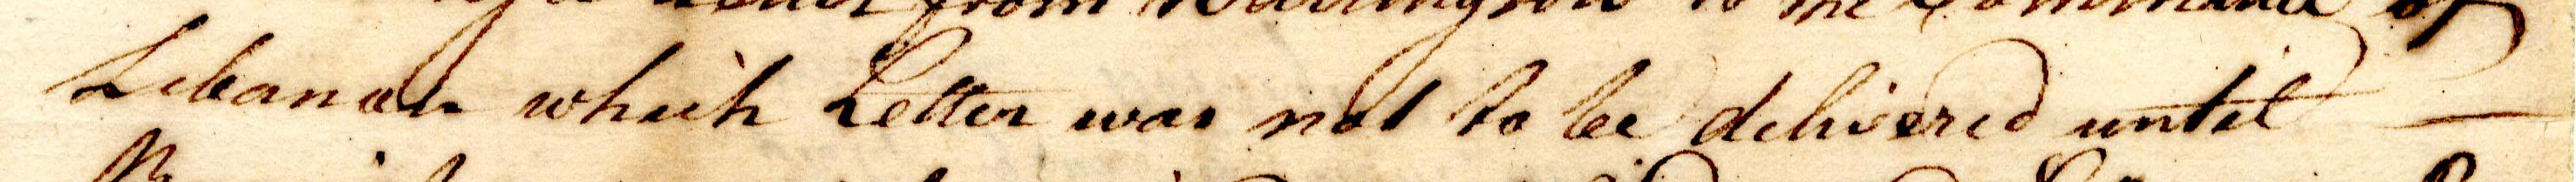Lebanon which Letter was not to be delivered until
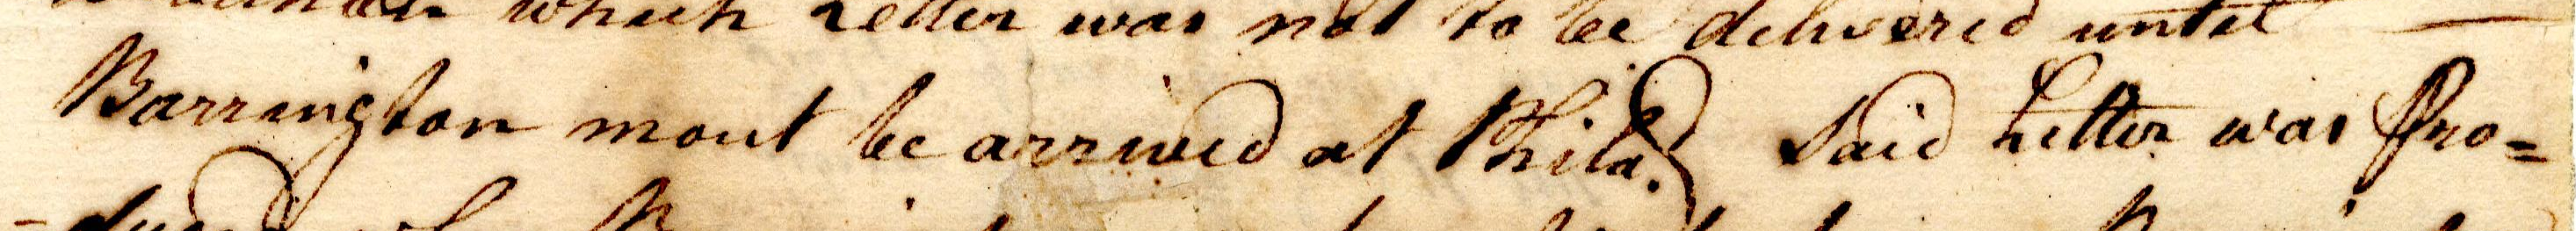Barrington mout be arrived at Phila^d. Said Letter was Pro-
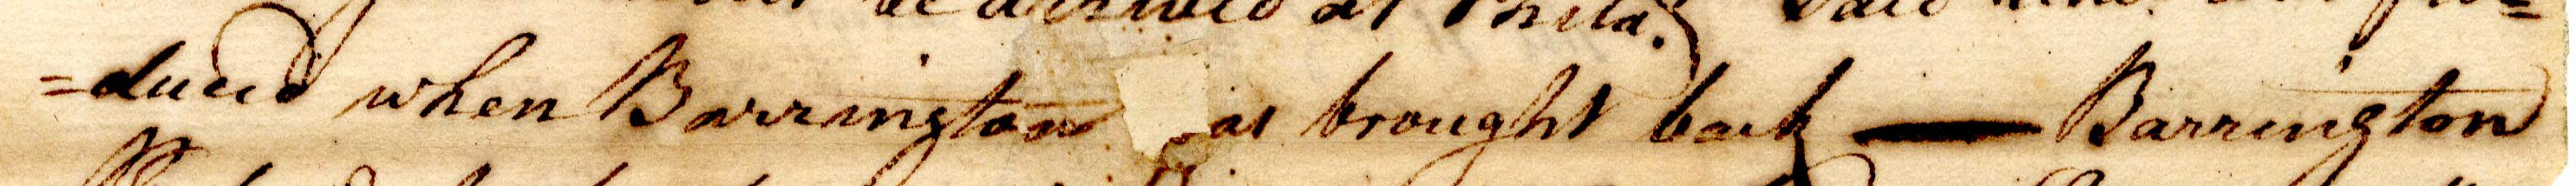-duced when Barrington was brought back. Barrington
